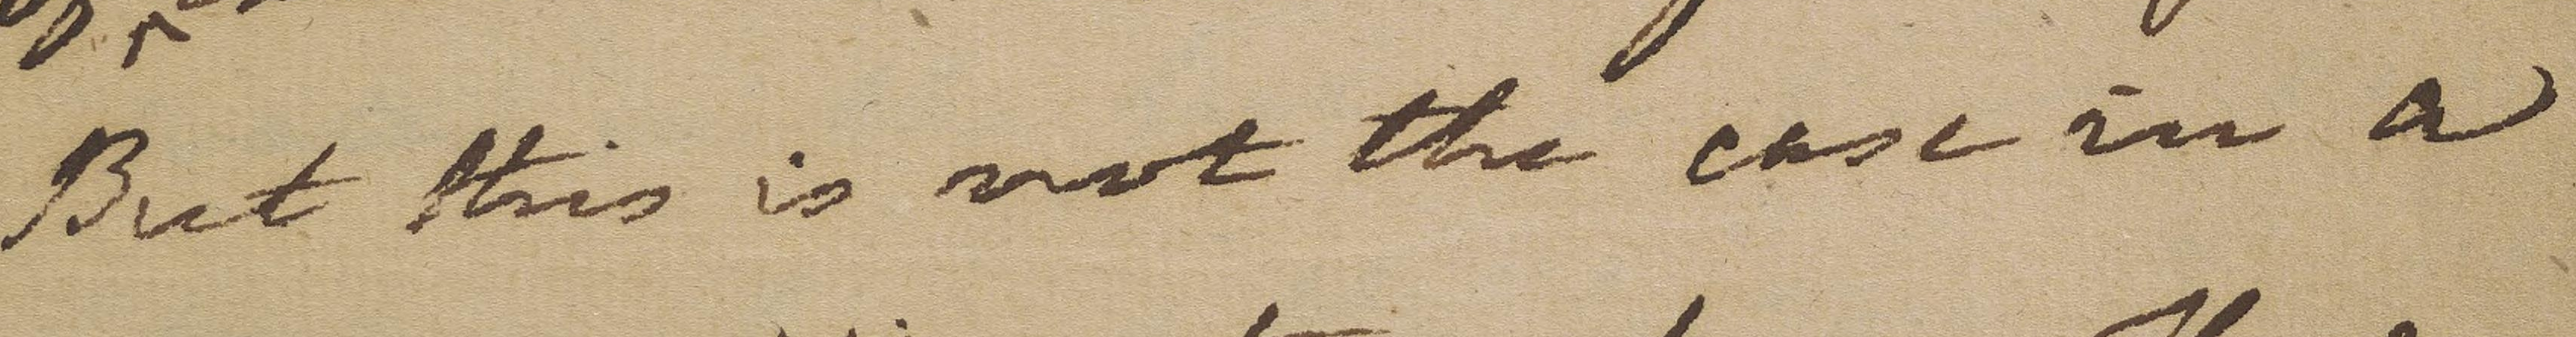But this is not the case in a
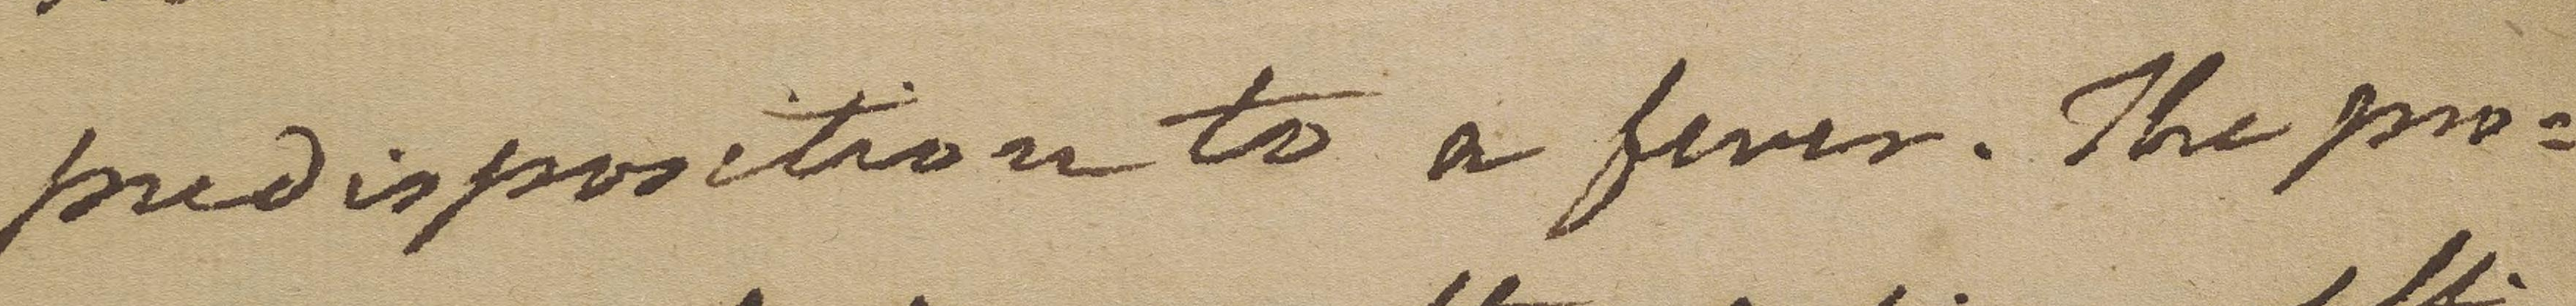predisposition to a fever. The pro-
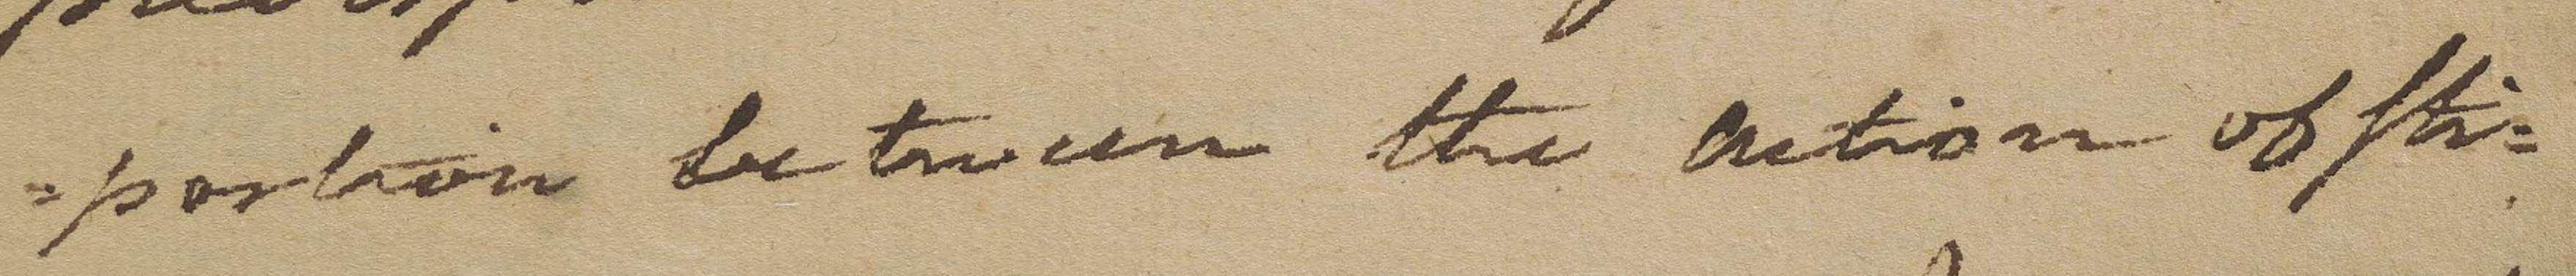-portion between the action of sti-
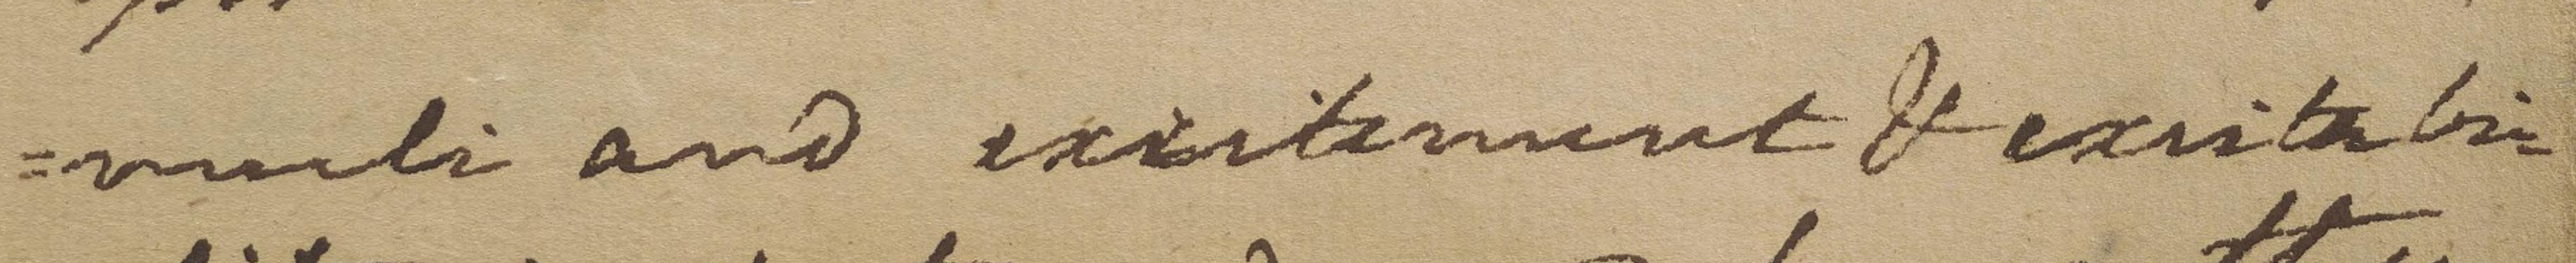muli and excitement & excitabi-
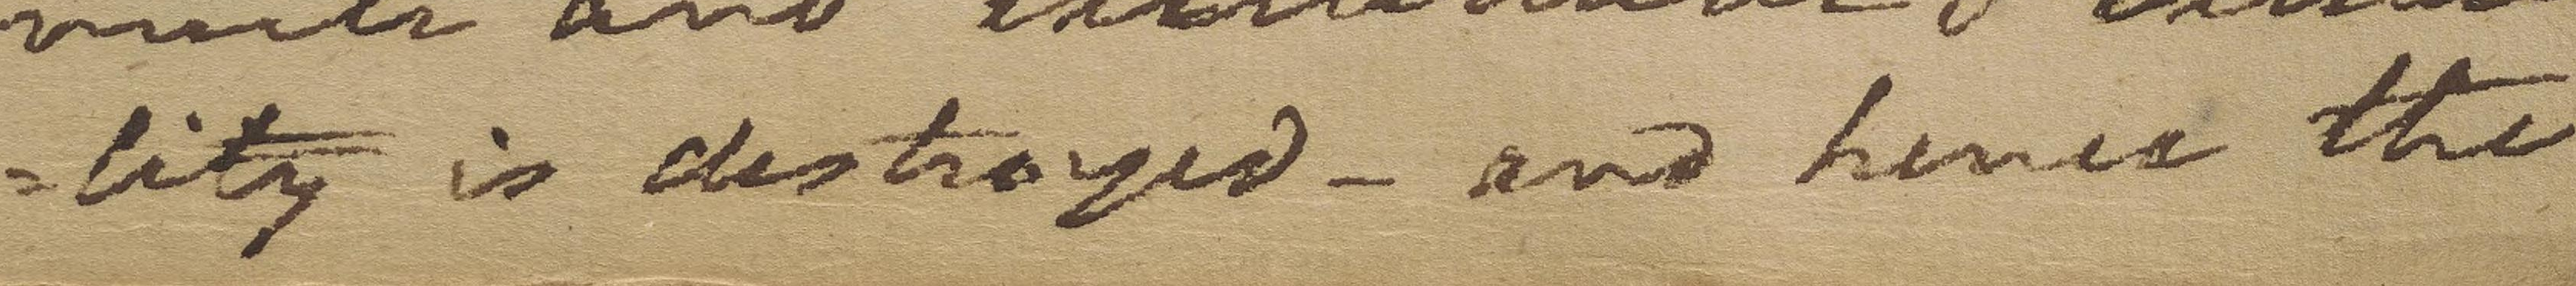-lity is destroyed, and hence the
